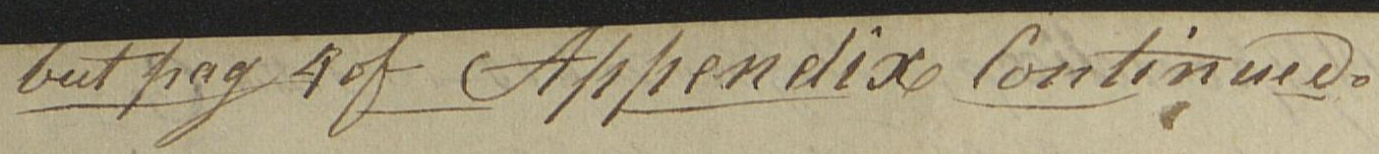but pag 4 of Appendix Continued
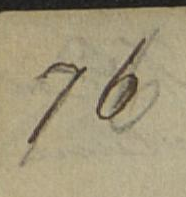76
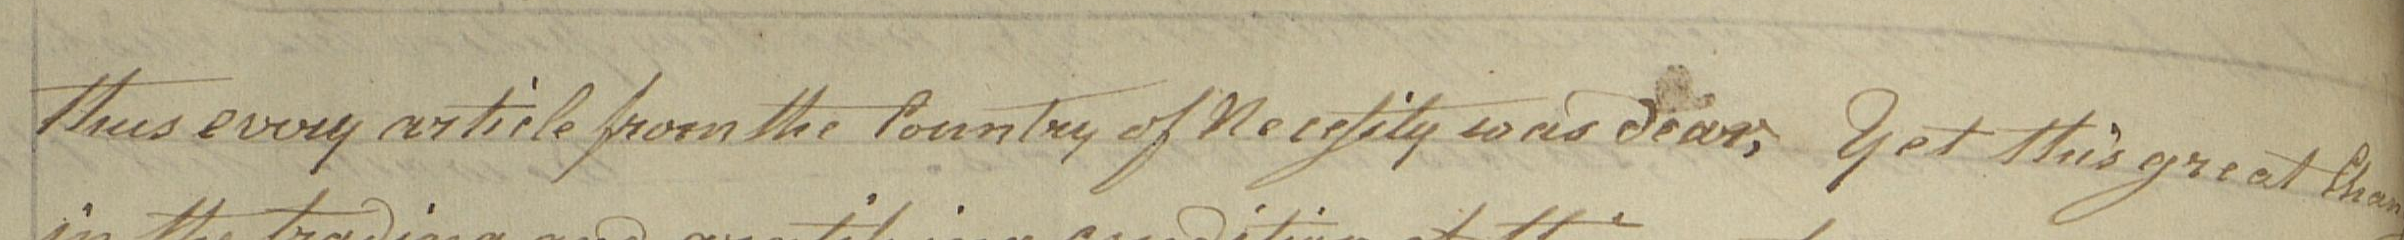Thus every article from the Country of Necesity was dear; Yet this great Chang-
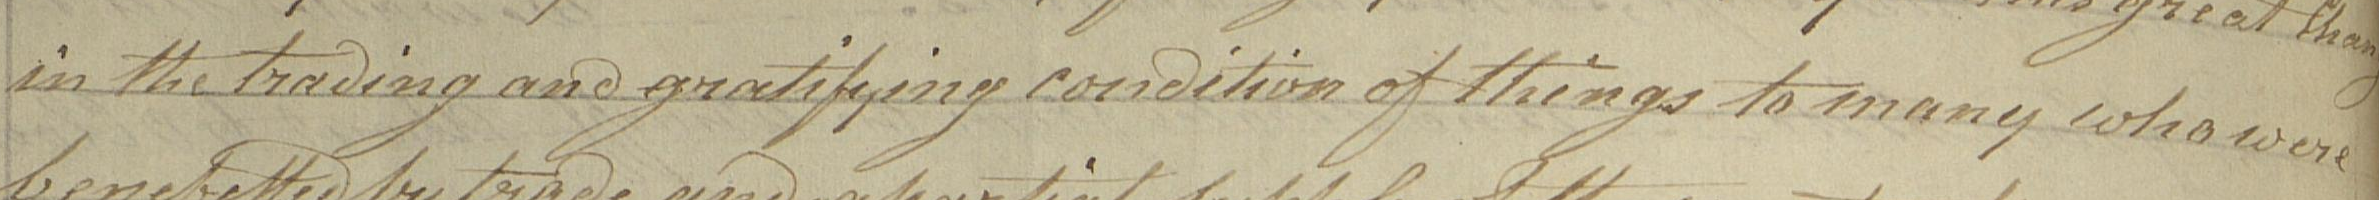in the trading and gratifying condition of things to many who were
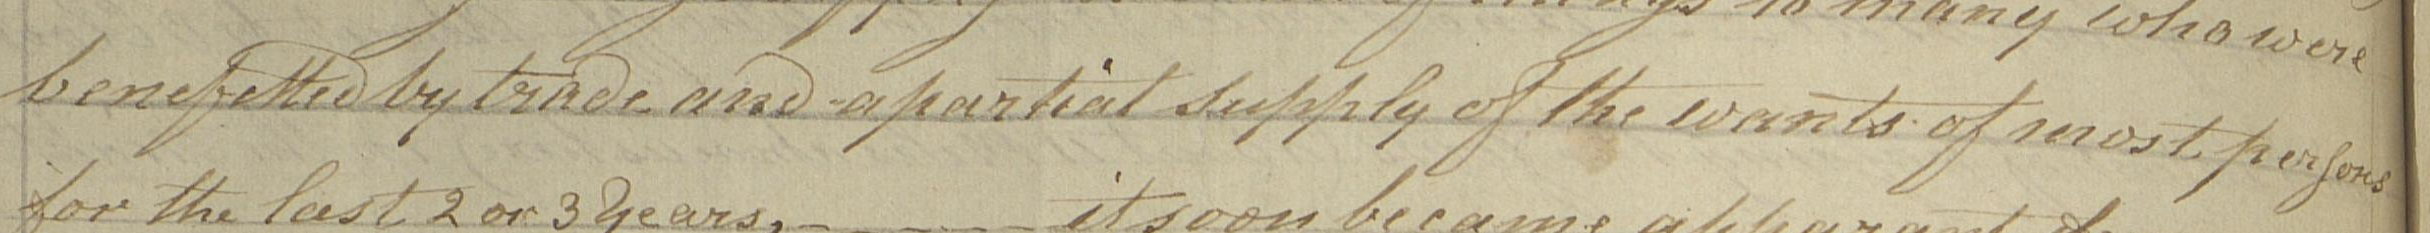benefitted by trade and a partial supply of the wants of most persons
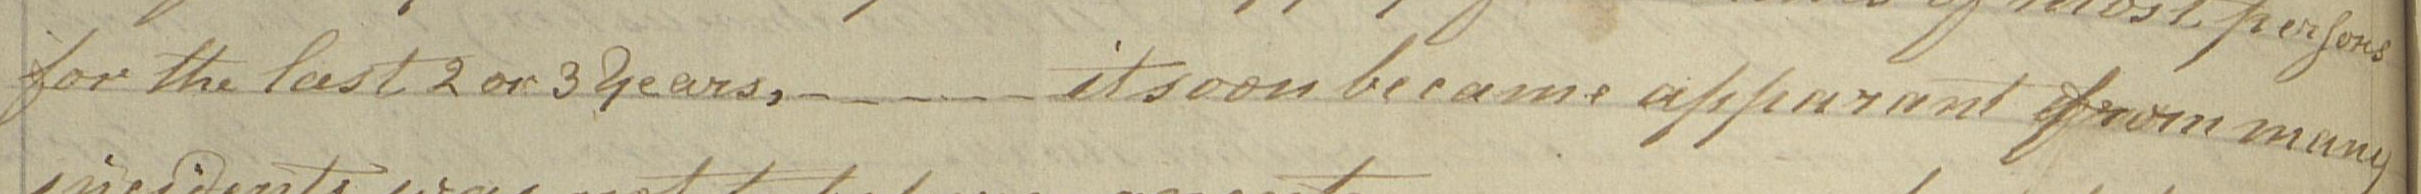for the last 2 or 3 Years. it soon became apparent from many
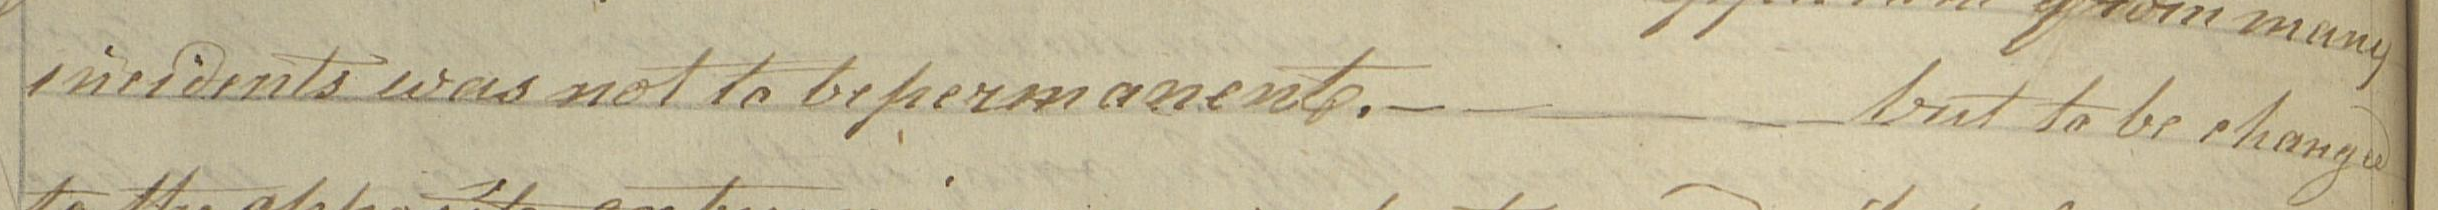incidents was not to be permanent. but to be changed
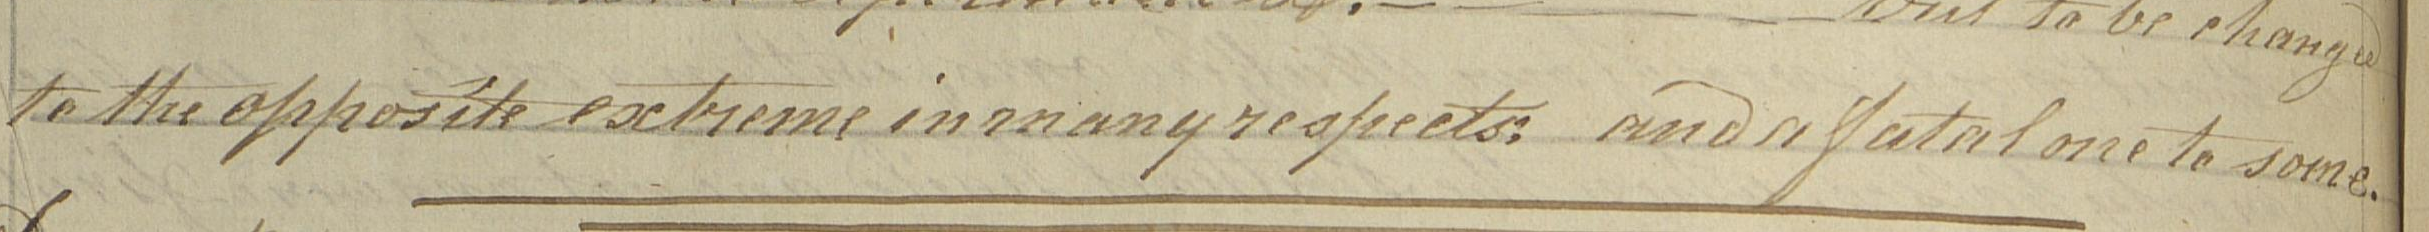to the opposite extreme in many respects and a fatal one to some.
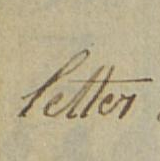letter
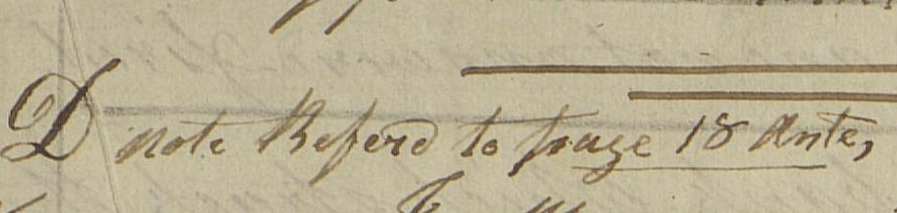D note Referd to page 18 Ante,
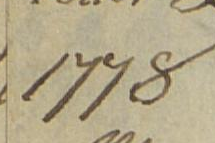1778
